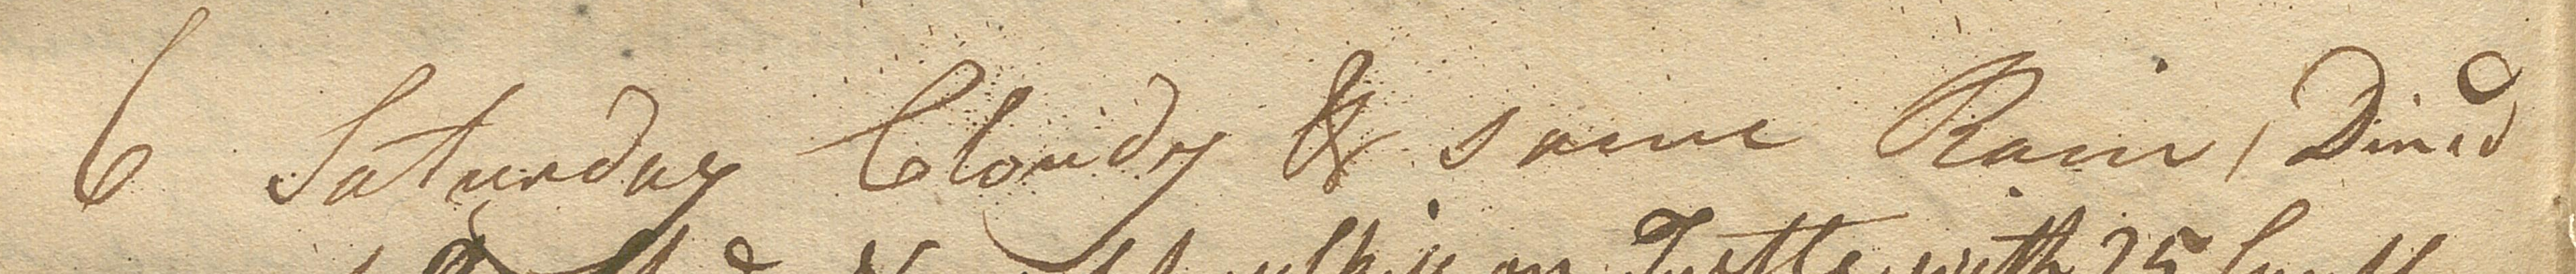6 Saturday Cloudy & same Rain, Dined
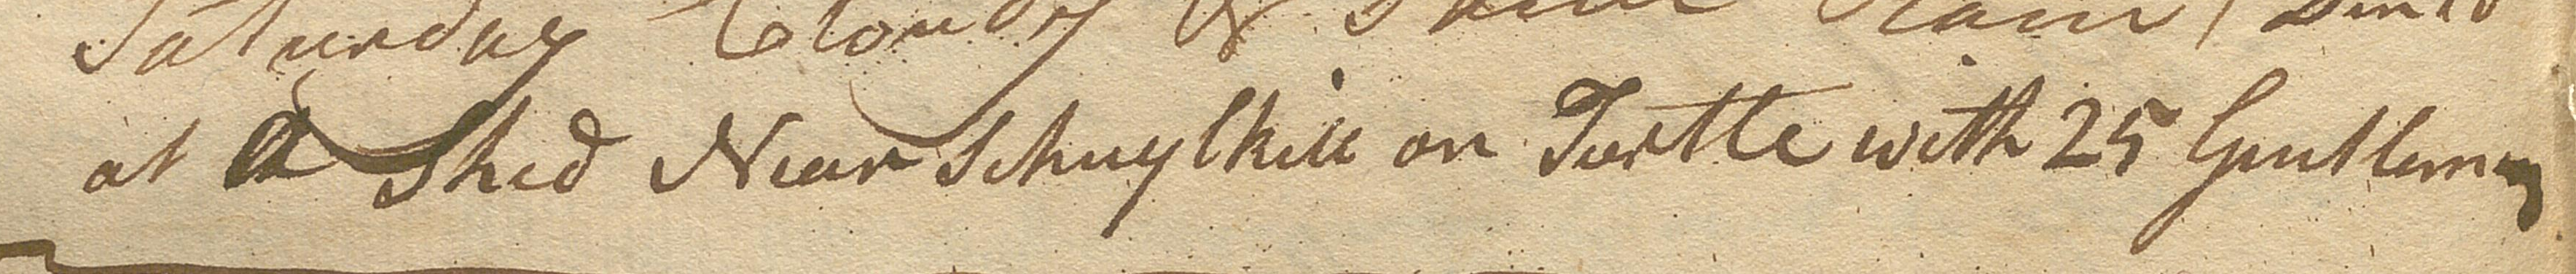at A Shed Near Schuylkill on Turtle with 25 Gentlemen
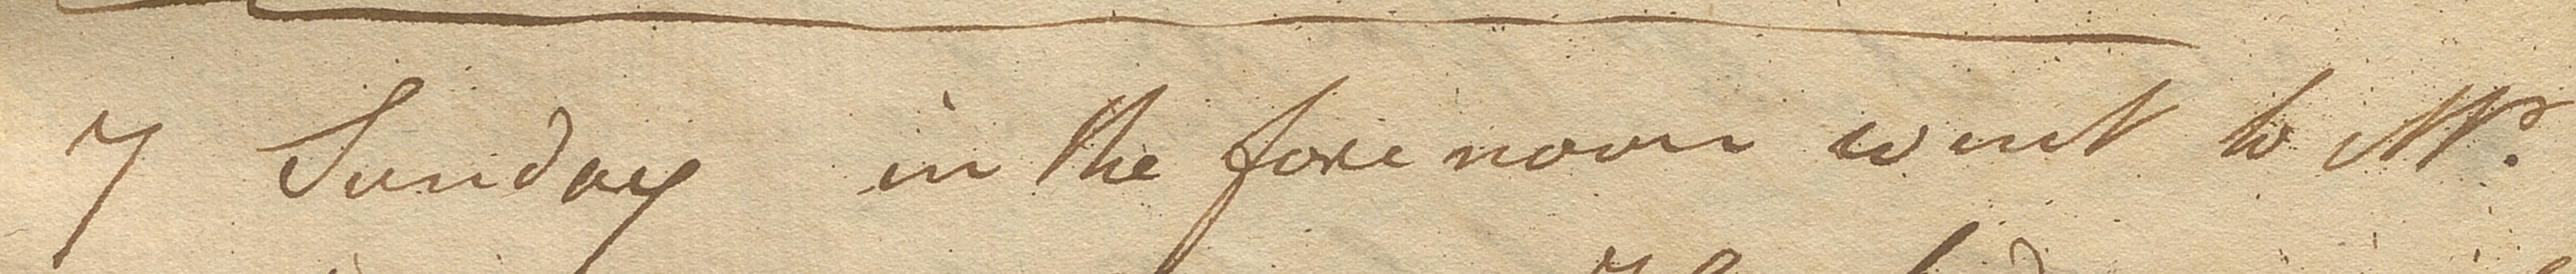7 Sunday in the forenoon went to M^r.
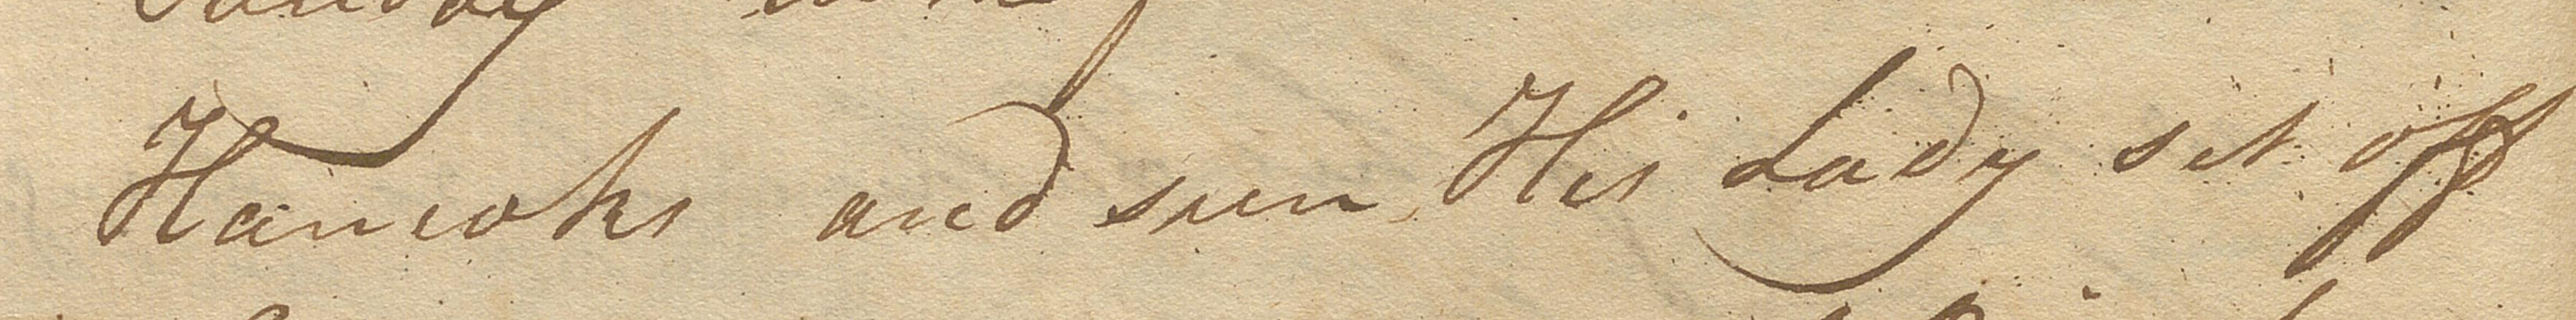Hancoks and seen His Lady set off
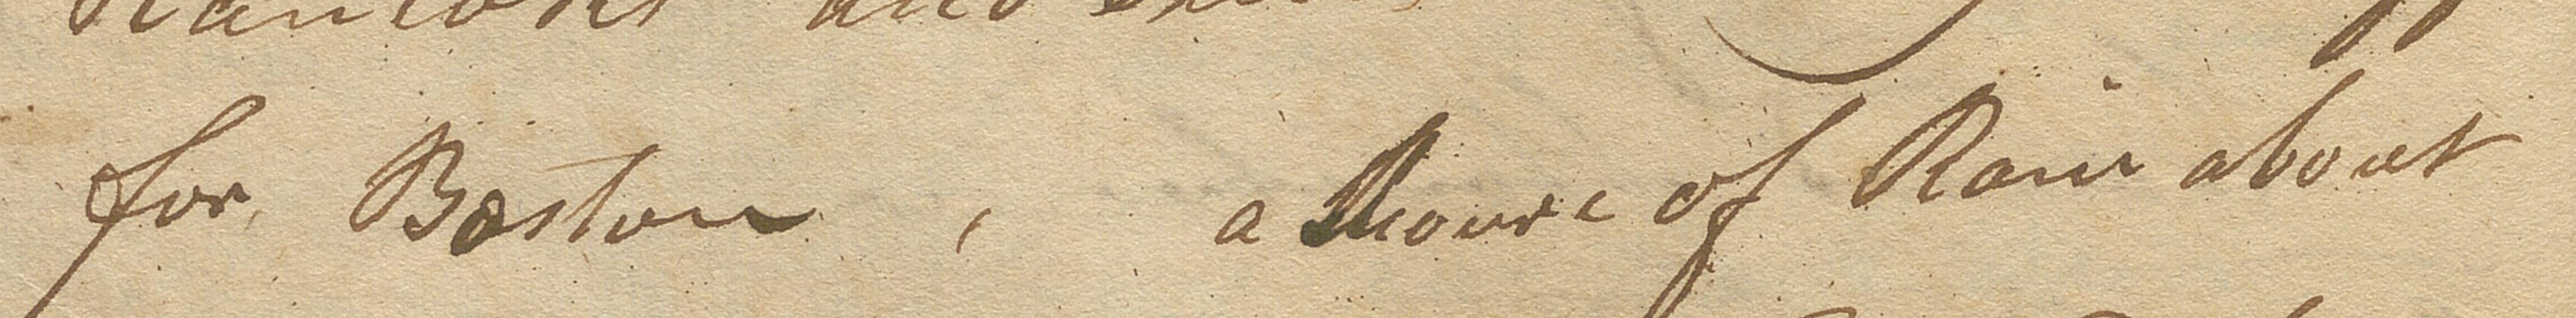for Boston, a Shoure of Rain about
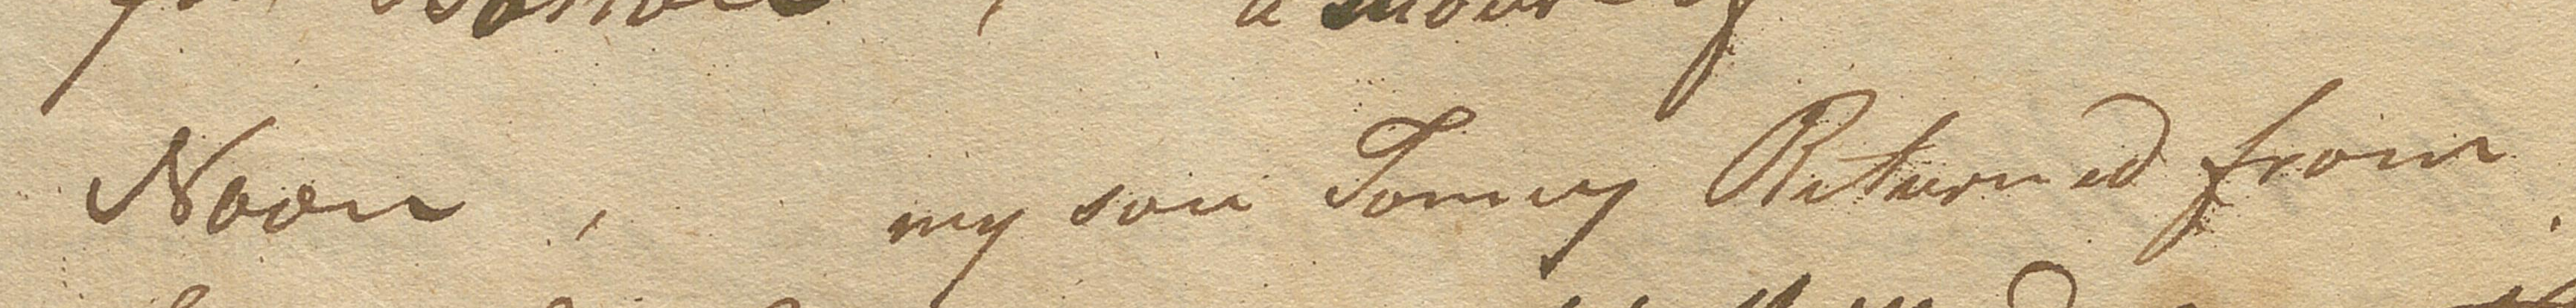Noon, my son Tomey Returned from
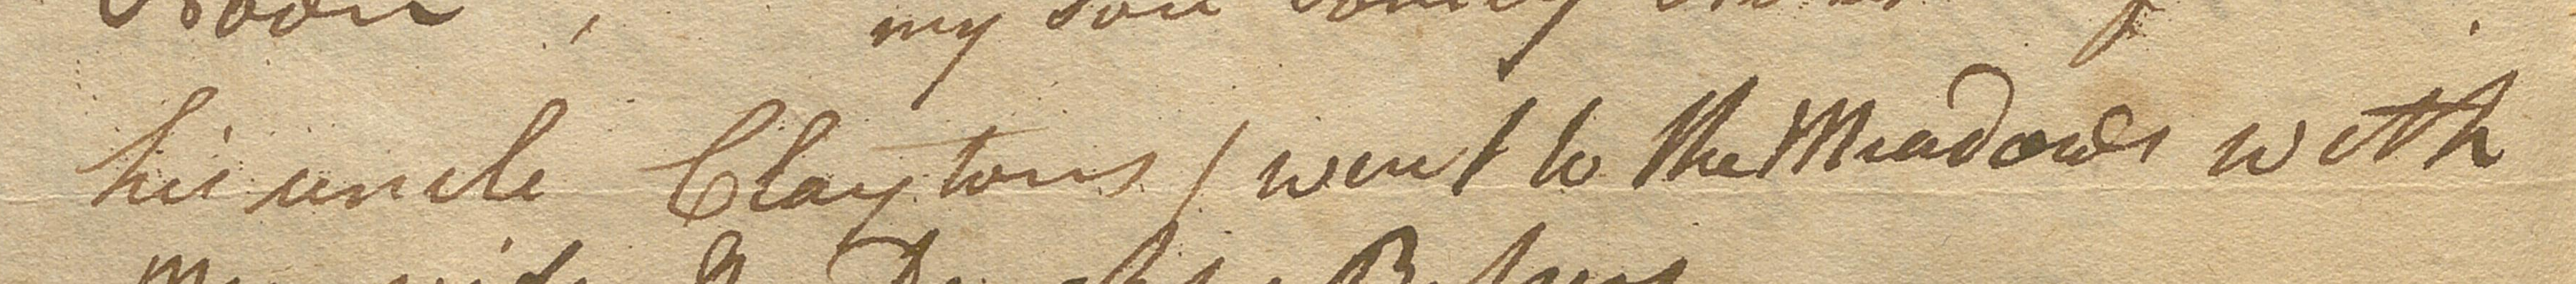his uncle Claytons / went to the Meadows with
